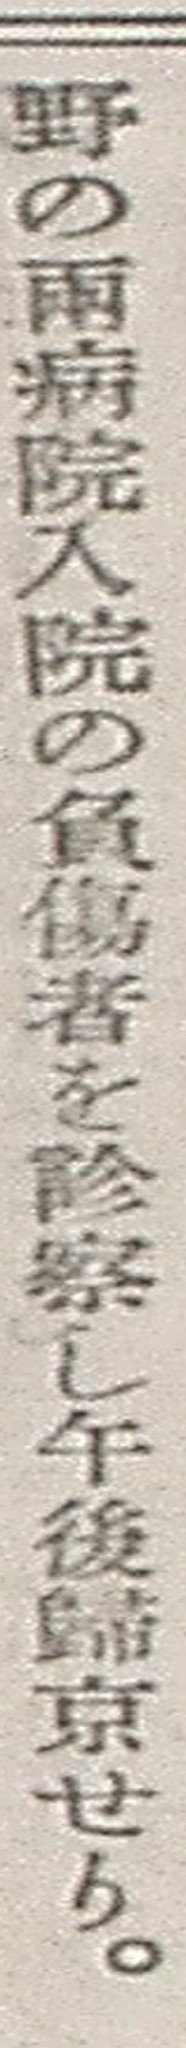野の両病院入院の負傷者を診察し午後帰京せり。
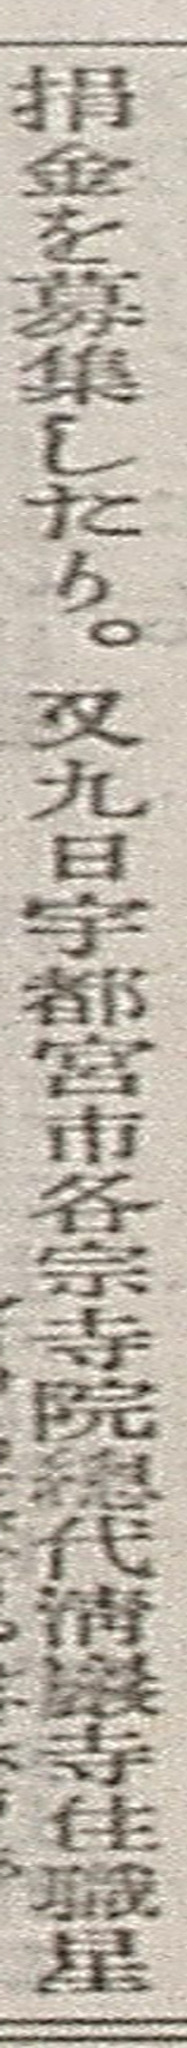捐金を募集したり。又九日宇都宮市各宗寺院総代清巌寺住職星
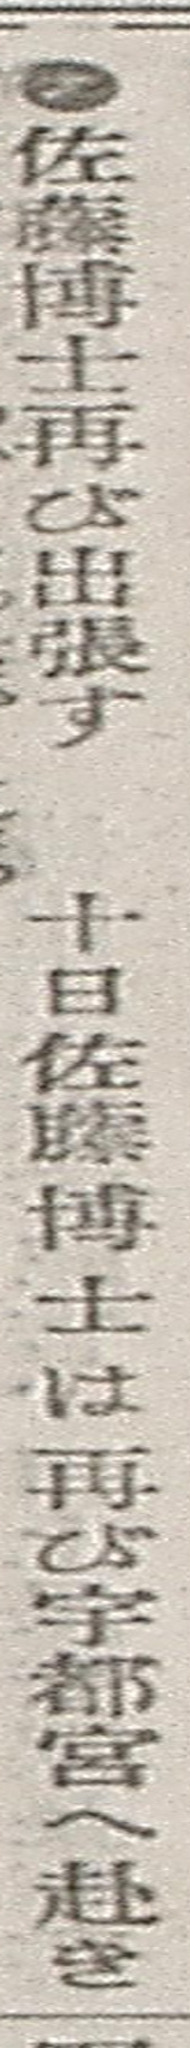●佐藤博士再び出張す十日佐藤博士は再び宇都宮へ赴き
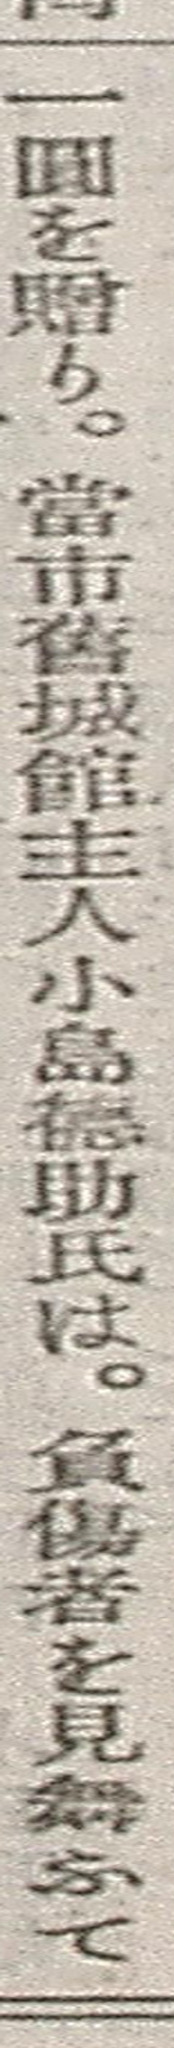一円を贈り。当市旧城館主人小島徳助氏は。負傷者を見舞ふて
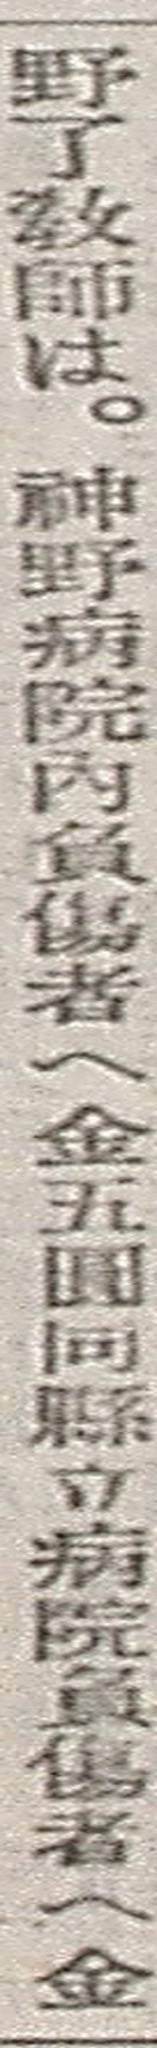野了教師は。神野病院内負傷者へ金五円同県立病院負傷者へ金
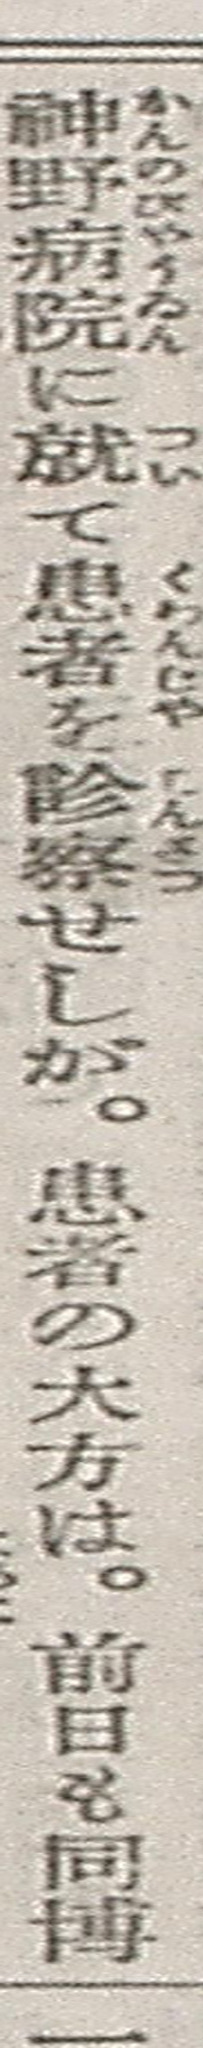神野病院に就て患者を診察せしが。患者の大方は。前日も同博
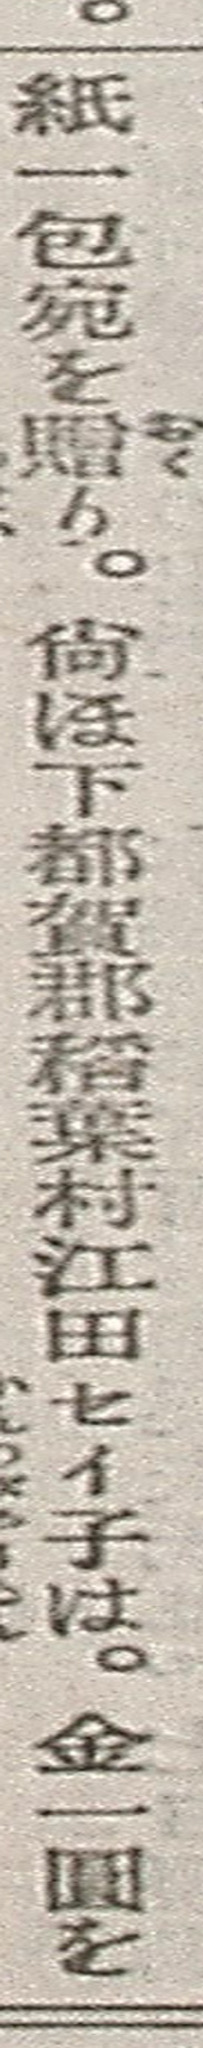紙一包宛を贈り。尚ほ下都賀郡稲葉村江田セイ子は。金一円を
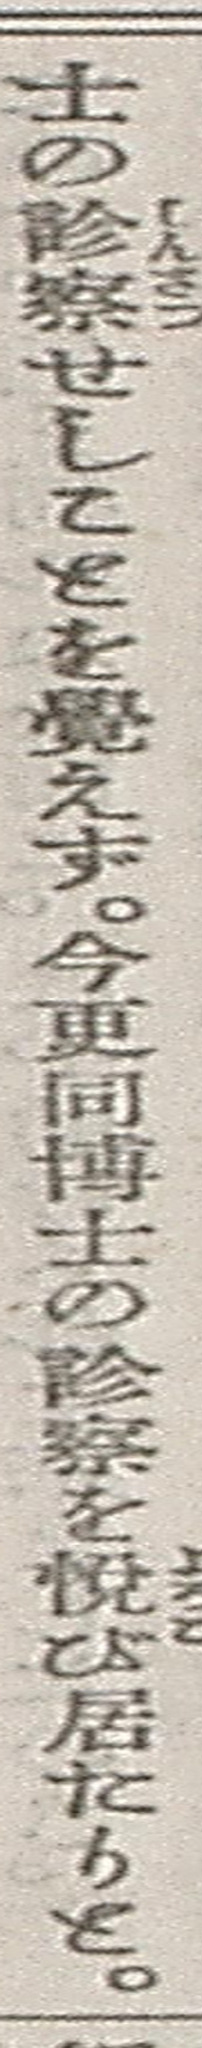士の診察せしことを覚えず。今更同博士の診察を悦び居たりと。
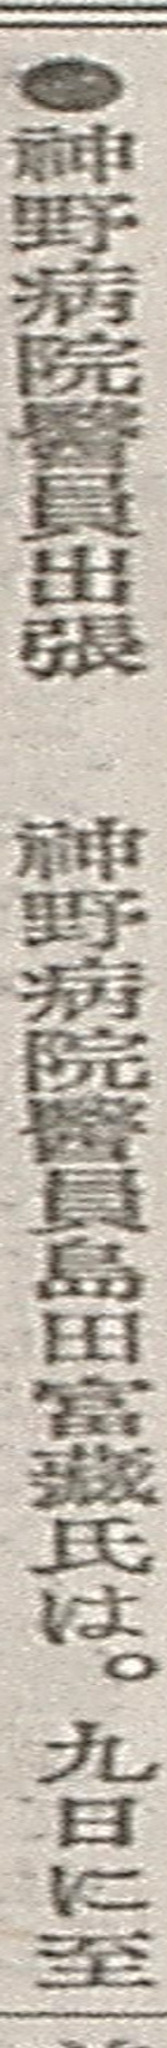●神野病院医員出張神野病院医員島田富蔵氏は。九日に至
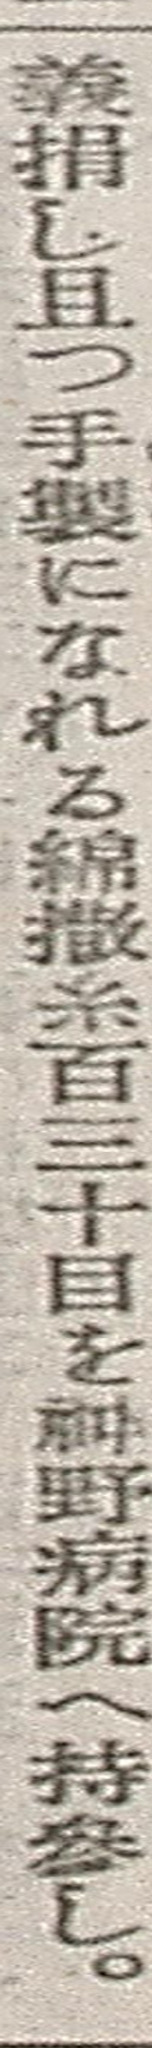義捐し且つ手製になれる綿撒糸百三十目を神野病院へ持参し。
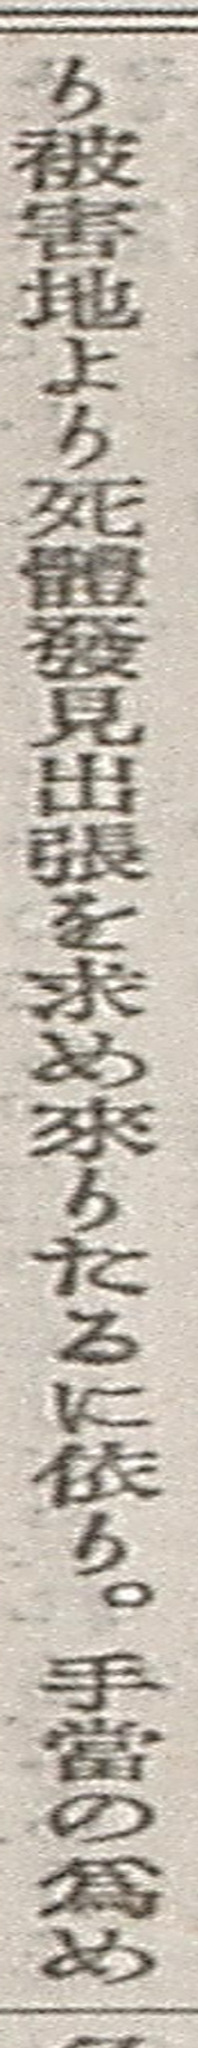り被害地より死体発見出張を求め来りたるに依り。手当の為め
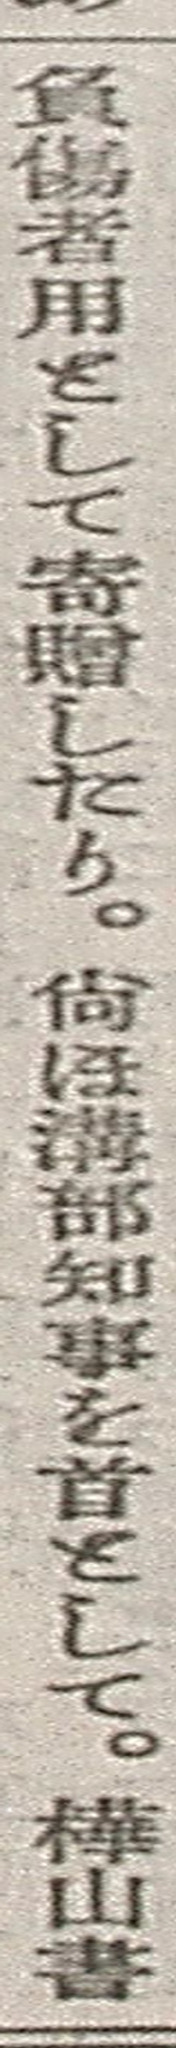負傷者用として寄贈したり。尚ほ溝部知事を首として。樺山書
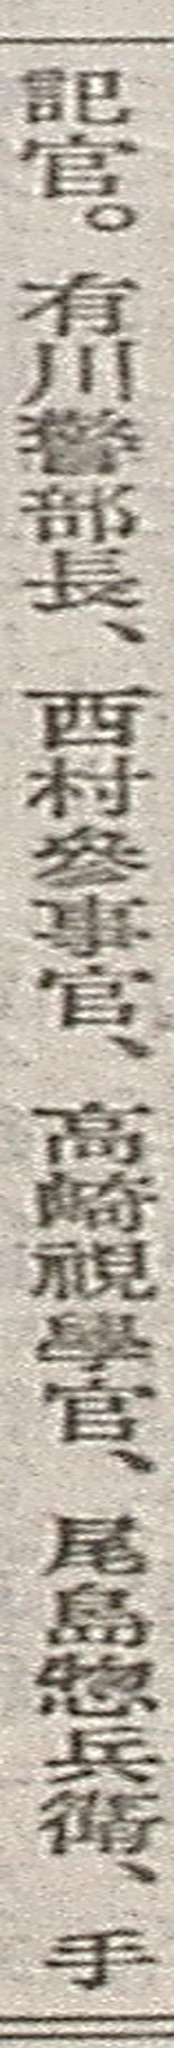記官。有川警部長、西村参事官、高崎視学官、尾島惣兵衛、手
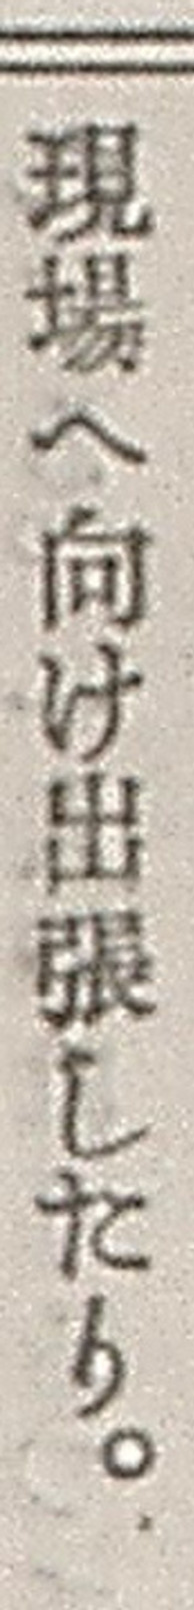現場へ向け出張したり。
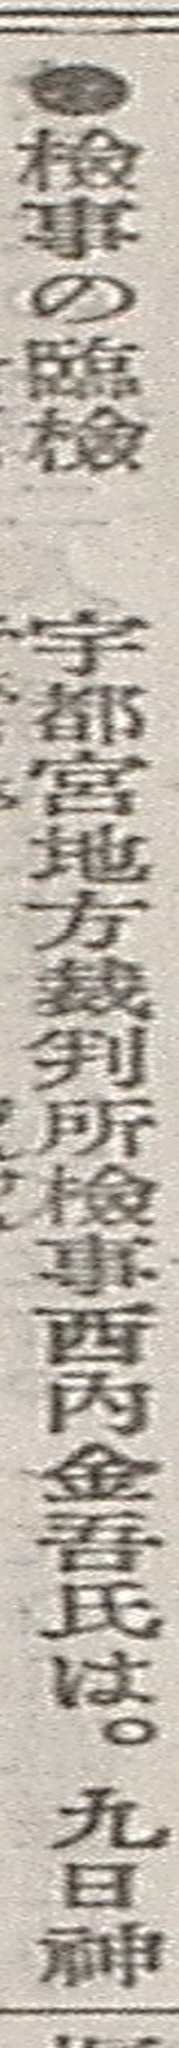●検事の臨検宇都宮地方裁判所検事西内金吾氏は。九日神
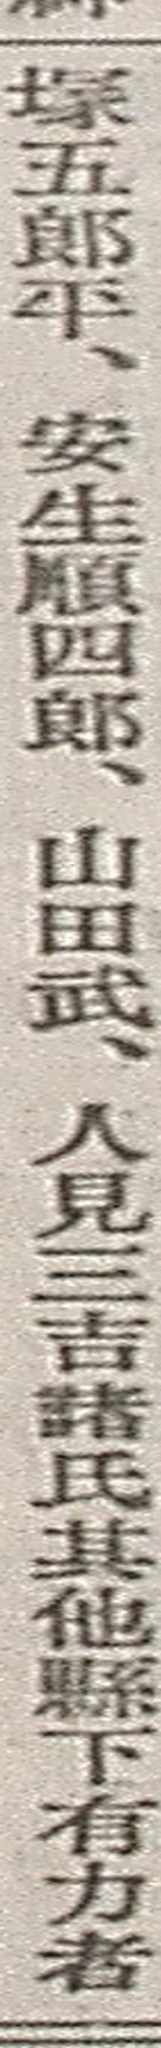塚五郎平、安生順四郎、山田武、人見三吉諸氏其他県下有力者
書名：風俗畫報臨時増刊第百九十九號　明治三十二年十月各地災害圖會（前編之續）
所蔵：東京大学地震研究所図書室 Earthquake Research Institute Library, The University of Tokyo, JAPAN
